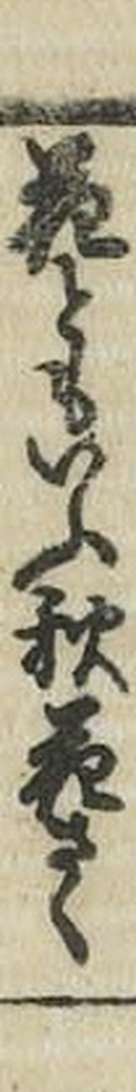花ともいふ秋花さく
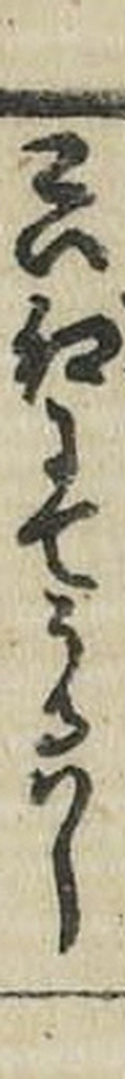こい紅にてうるはし

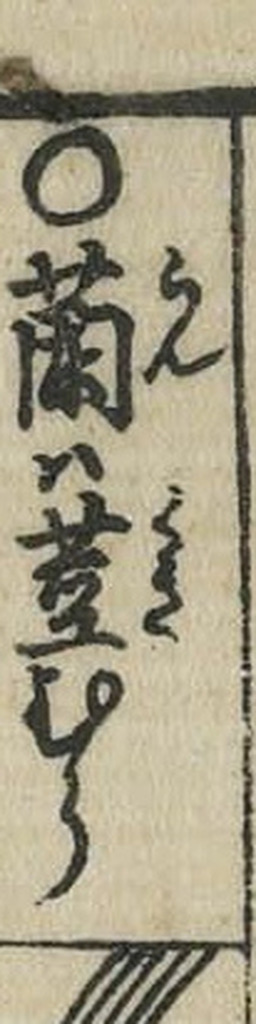○蘭は茎むら
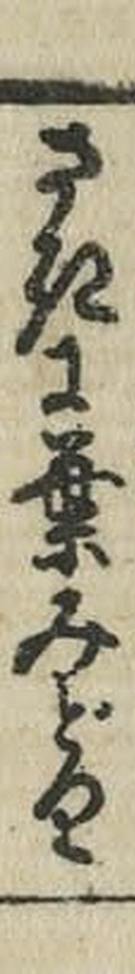さきに葉みどり
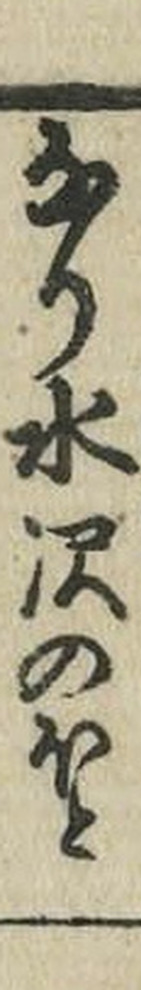なり水沢のほと
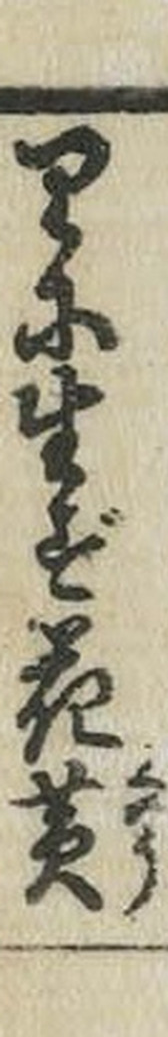りに生ず花黄
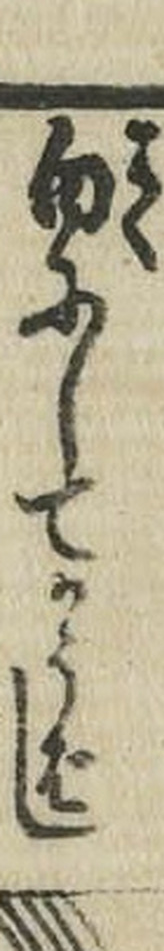白にしてかうばし
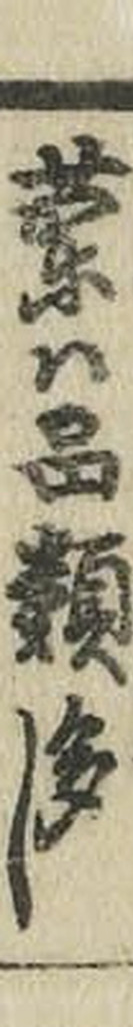蘭は品類多し
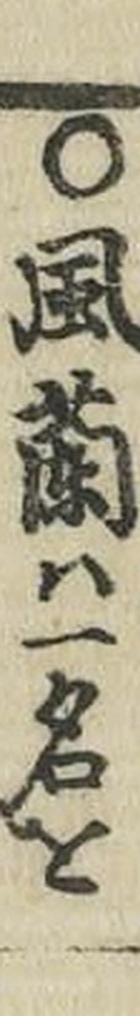○風蘭は一名を
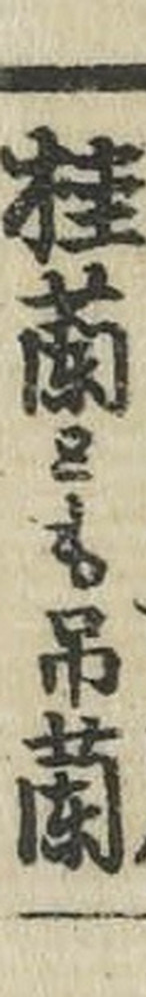桂蘭とも吊蘭
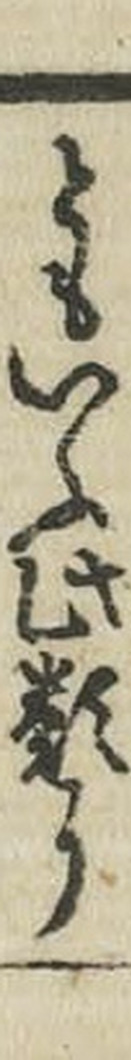ともいふ此類に
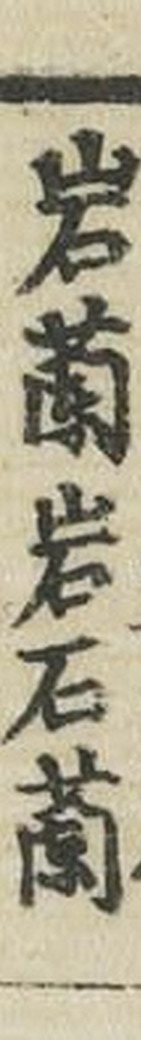岩蘭岩石蘭
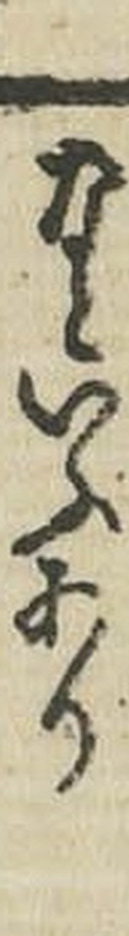なといふあり
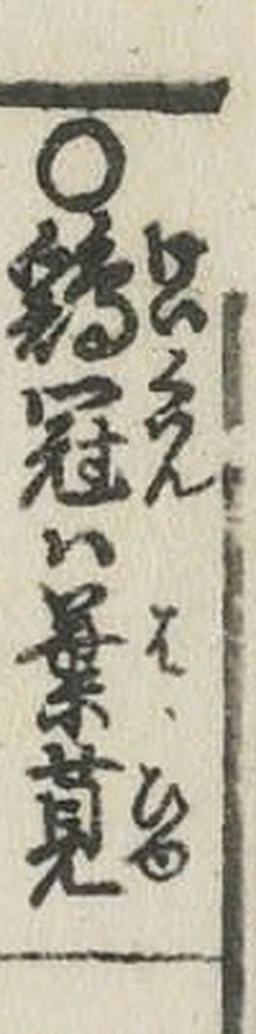○鶏冠は葉莧
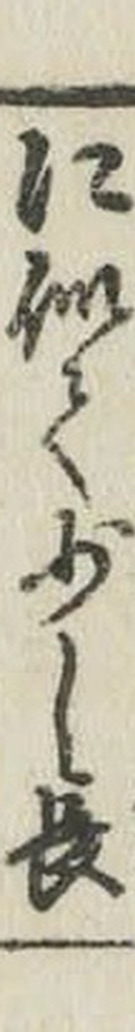に似て少し長
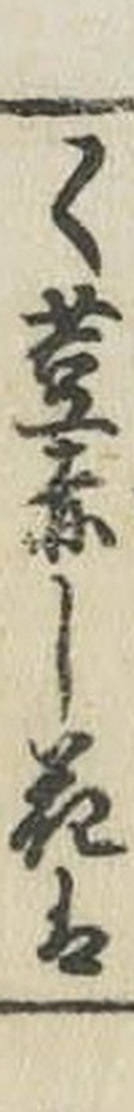く茎赤し花は
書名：増補頭書訓蒙図彙大成 10巻 9:巻之20
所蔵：東京学芸大学教育コンテンツアーカイブ
